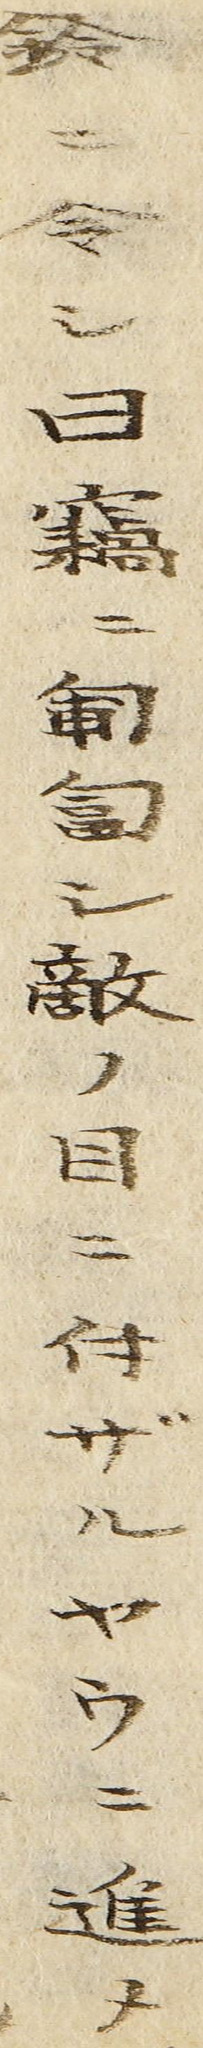鈴ニ令シ曰竊ニ匍匐シ敵ノ目ニ付ザルヤウニ進メ
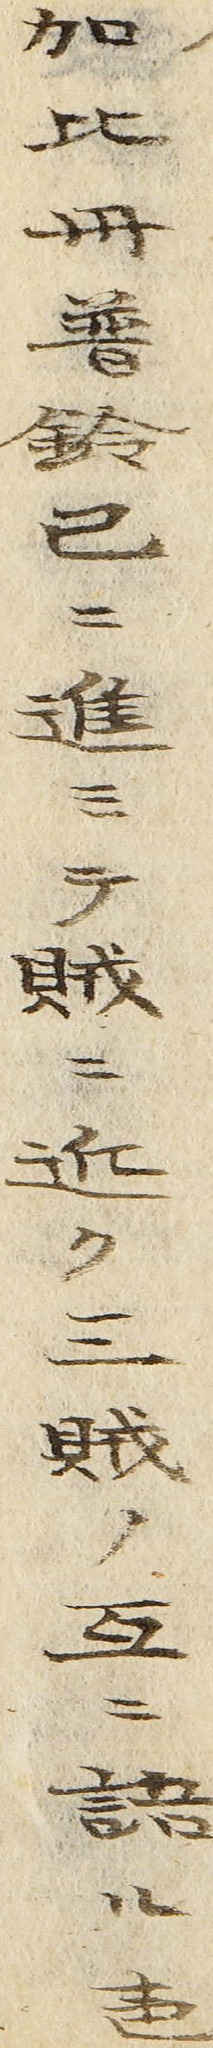加比丹普鈴已ニ進ミテ賊ニ近ク三賊ノ互ニ語ル声
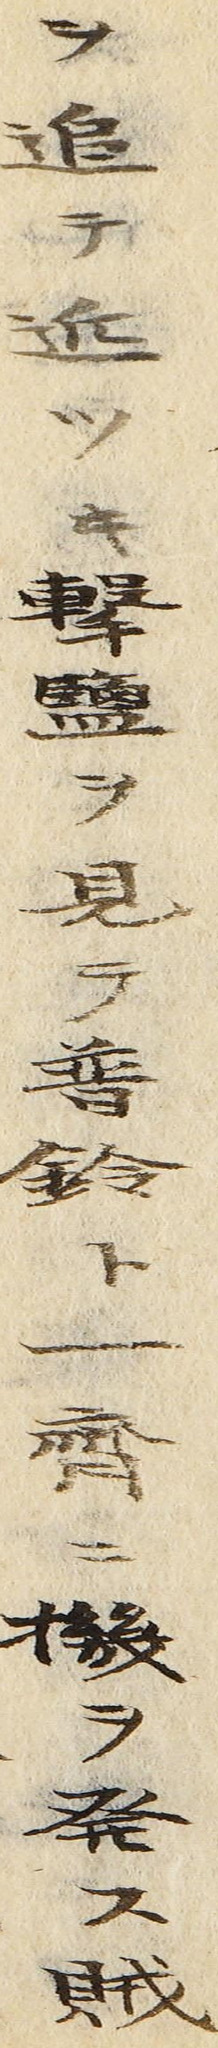ヲ追テ近ツキ撃盬ヲ見テ普鈴ト一斉ニ機ヲ発ス賊
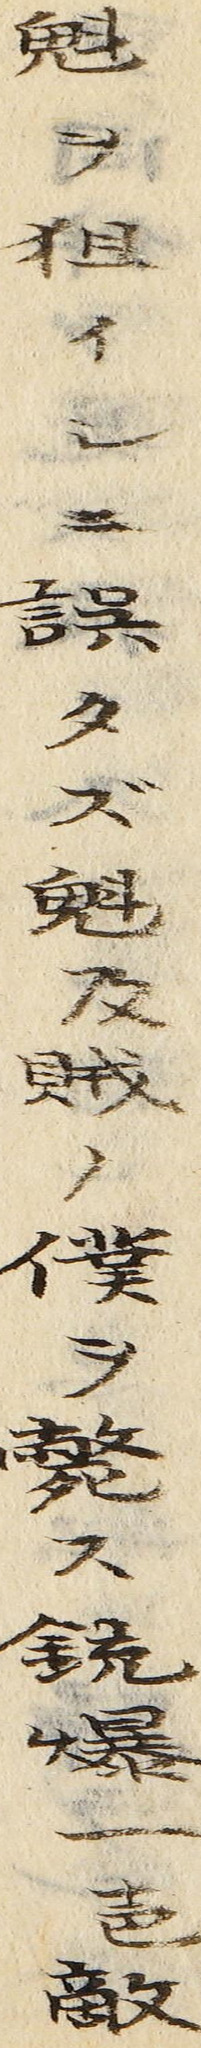魁ヲ狙イシニ誤タズ魁及賊ノ僕ヲ斃ス銃爆一声敵
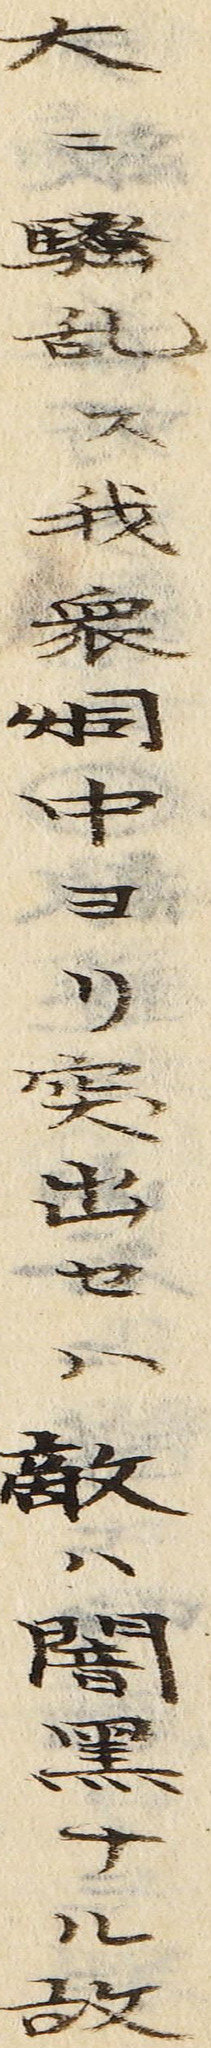大ニ騒乱ス我衆煙中ヨリ突出セハ敵ハ闇黒ナル故
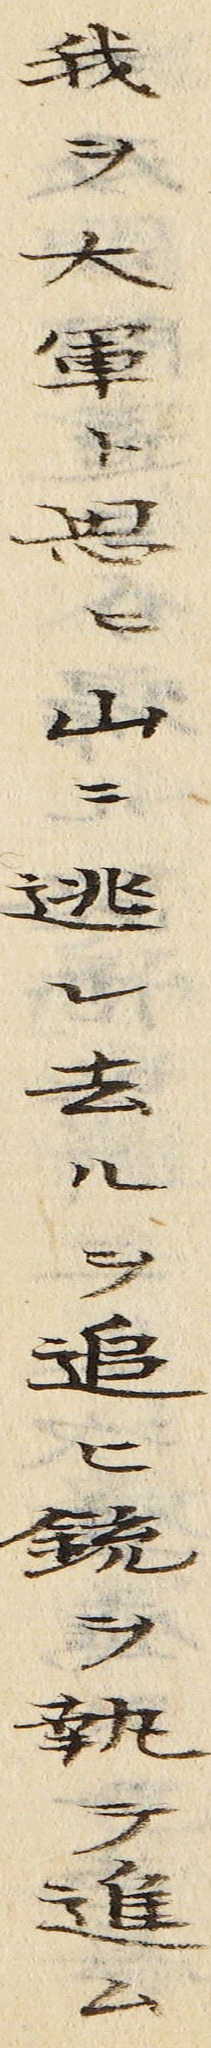我ヲ大軍ト思ヒ山ニ逃レ去ルヲ追ヒ銃ヲ執テ進ム
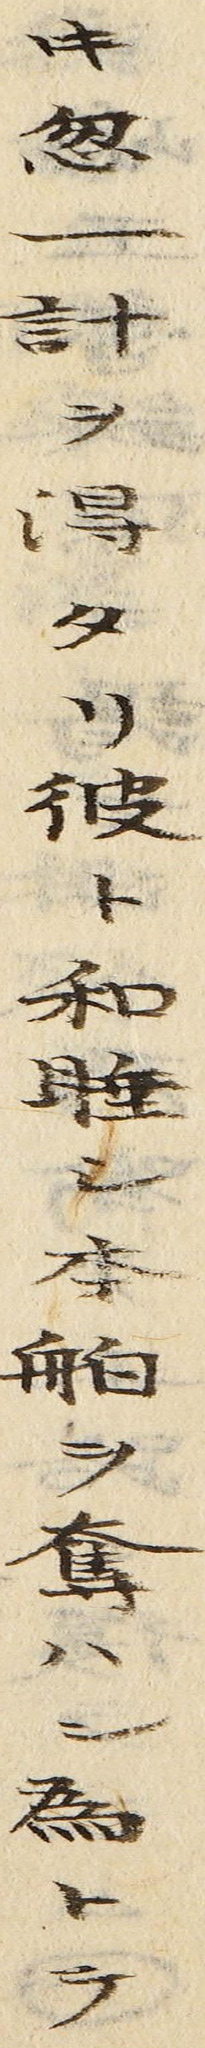トキ忽一計ヲ得タリ彼ト和睡シ本舶ヲ奪ハン為トテ
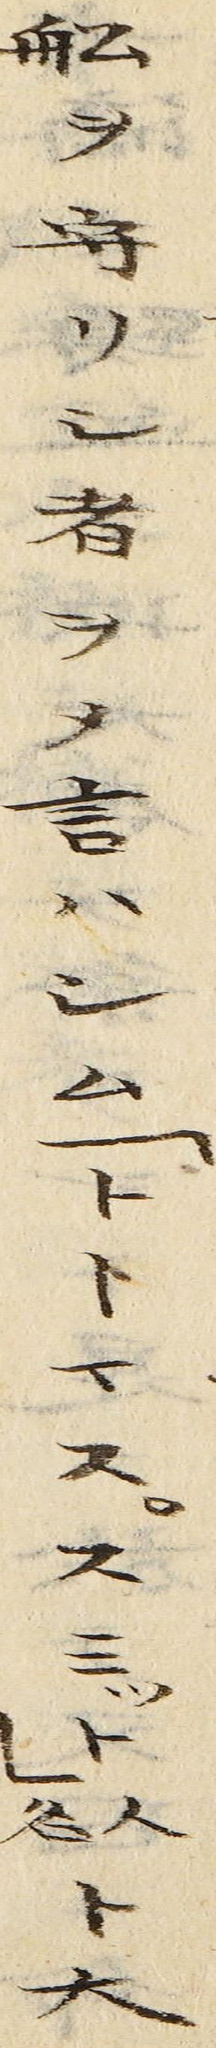船ヲ守リシ者ヲシテ言ハシム「トーマス。スミット」人名ト大
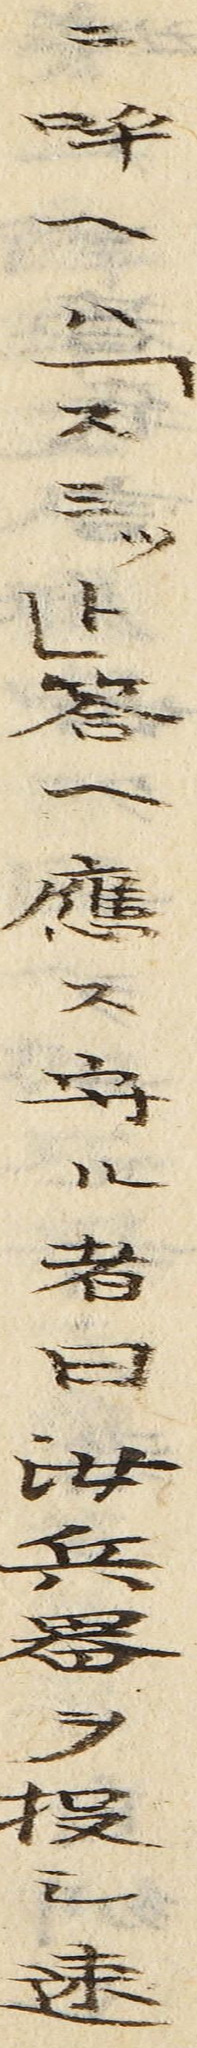ニ呼ヘハ「スミット」答ヘ応ス守ル者曰汝兵器ヲ投シ速
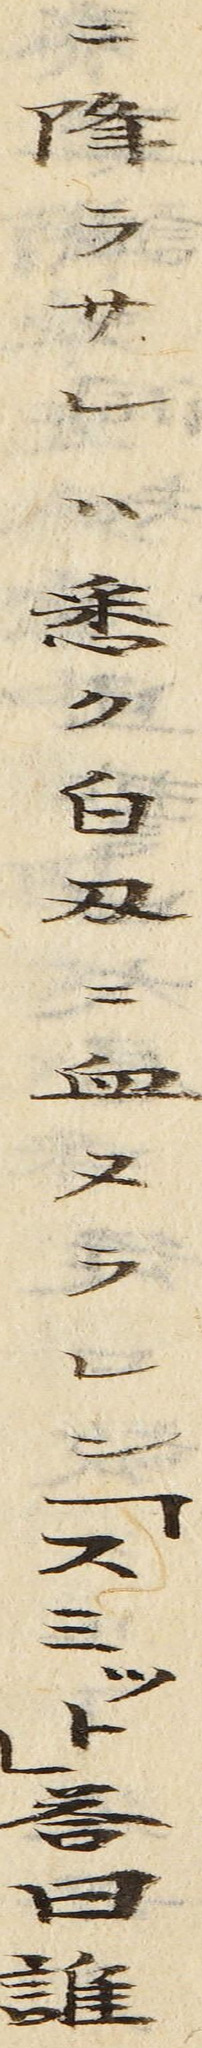ニ降ラサレハ悉ク白刃ニ血ヌラレン「スミット」答曰誰
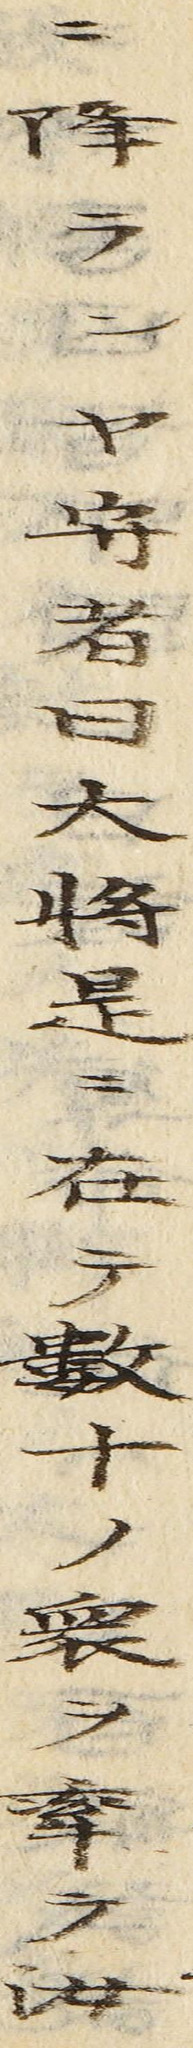ニ降ランヤ守者曰大将是ニ在テ数十ノ衆ヲ率テ汝
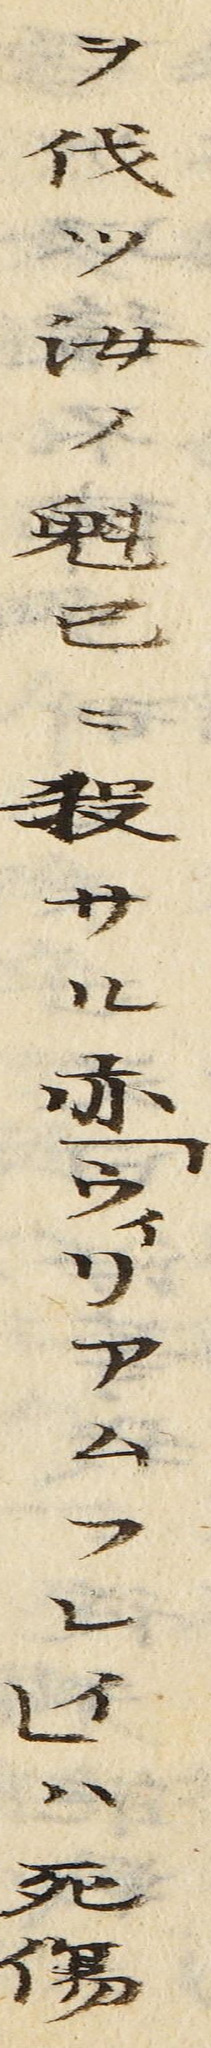ヲ伐ツ汝ノ魁已ニ殺サル亦「ウィリアムフレイ」ハ死傷
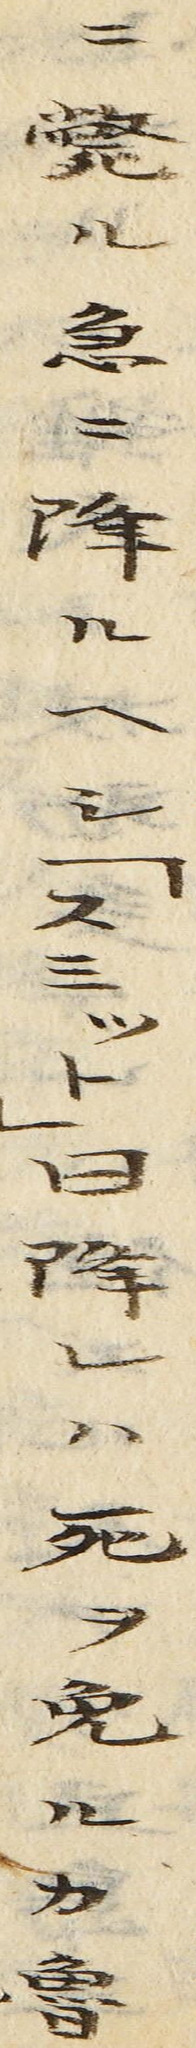ニ斃ル急ニ降ルヘシ「スミット」曰降レハ死ヲ免ルカ魯
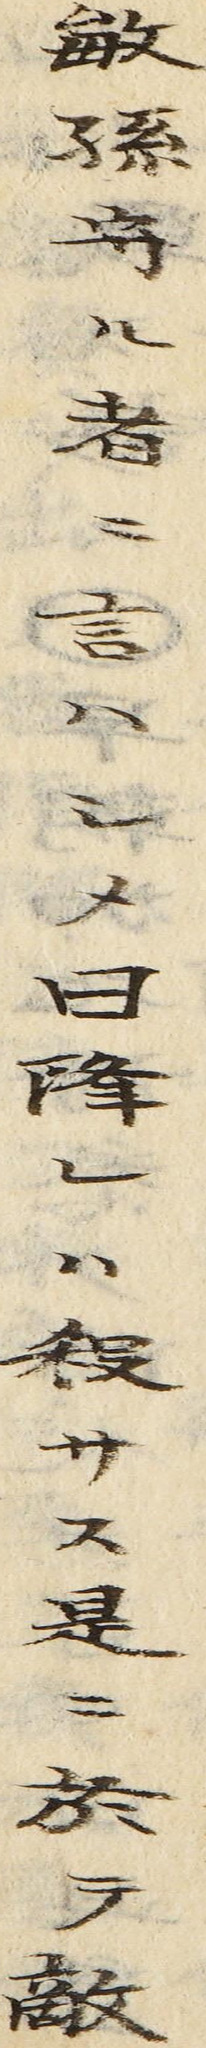敏孫守ル者ニ言ハシメ曰降レハ殺サス是ニ於テ敵
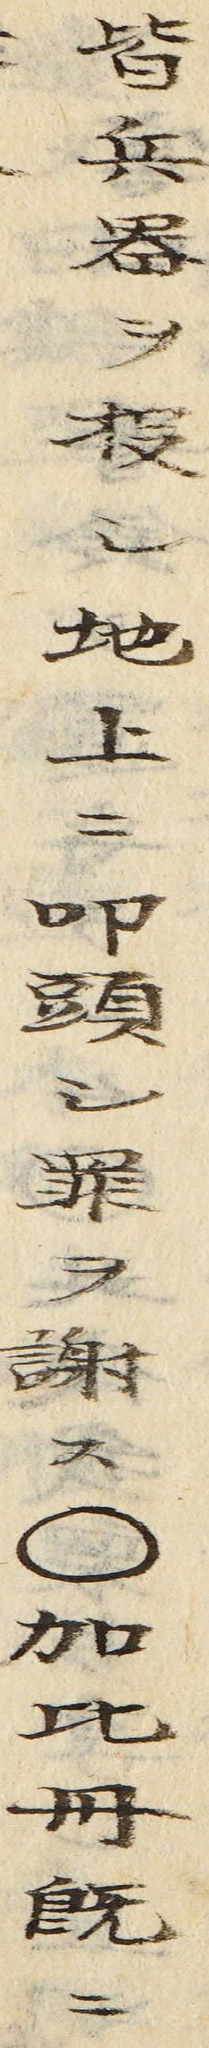皆兵器ヲ投シ地上ニ叩頭シ罪ヲ謝ス◯加比丹既ニ
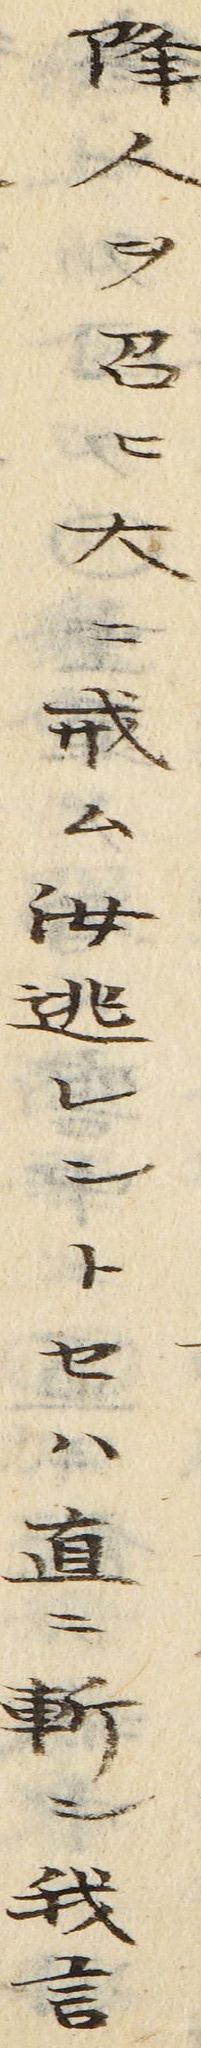降人ヲ召ヒ大ニ戒ム汝逃レントセハ直ニ斬ン我言
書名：漂流紀事
